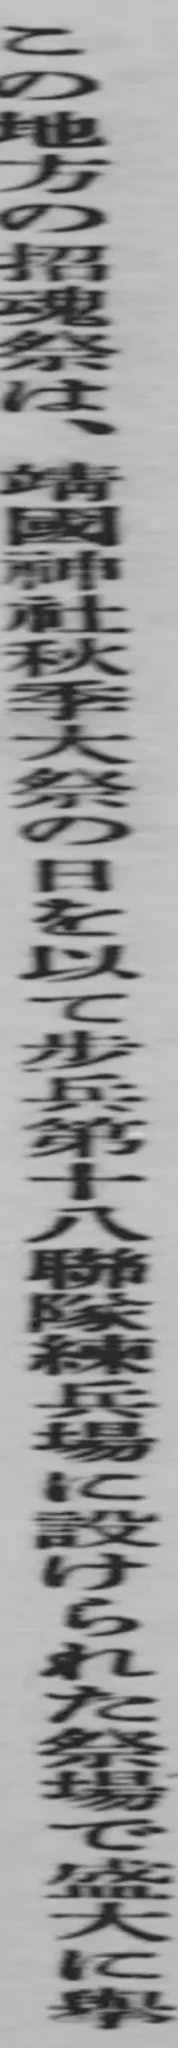この地方の招魂祭は、靖國神社秋季大祭の日を以て歩兵第十八聯隊練兵場に設けられた祭場で盛大に擧
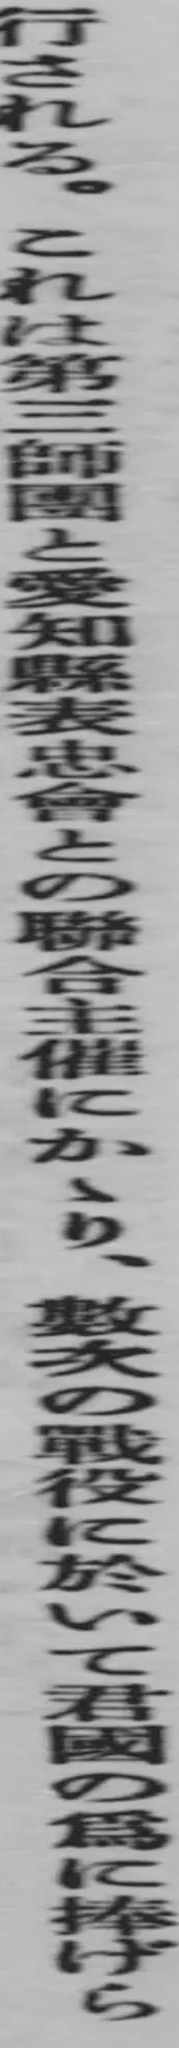行される。これは第三師團と愛知懸表忠會との聯合主催にかゝり、數次の戰役に於いて君國の爲に捧げら
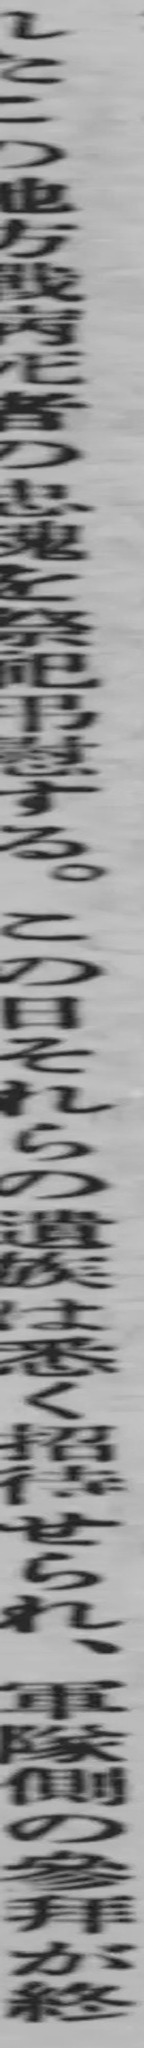れたこの地方戰病死者の忠魂を祭祀弔慰する。この日それらの遺族は悉く招待せられ、軍隊側の參拜が終
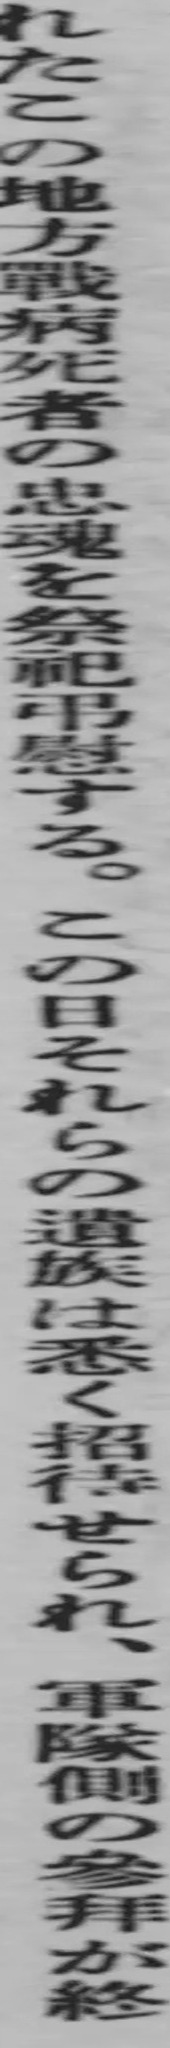れたこの地方戰病死者の忠魂を祭祀弔慰する。この日それらの遺族は悉く招待せられ、軍隊側の參拜が終
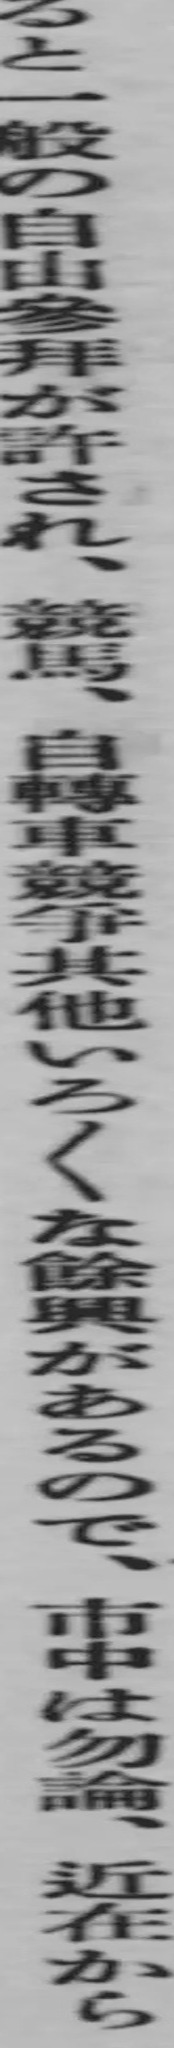ると一般の自由參拜が許され、競馬、自轉車競爭其他いろ〳〵な餘興があるので、市中は勿論、近在から
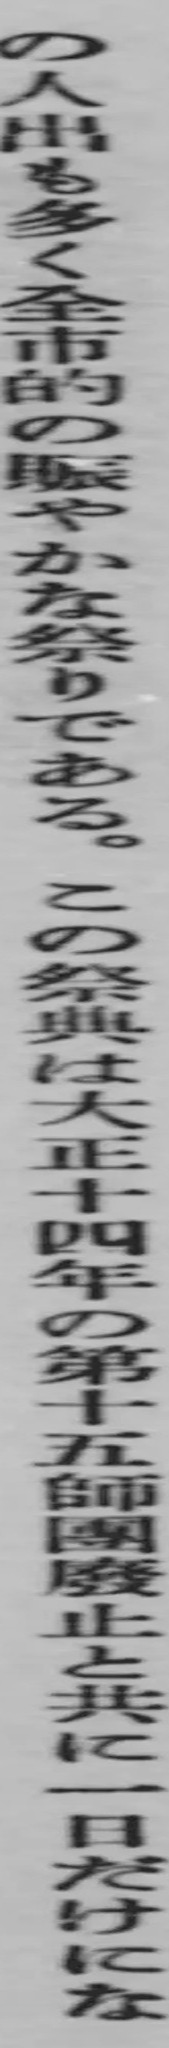の人出も多く全市的の賑やかな祭りである。この祭典は大正十四年の第十五師團廢止と共に一日だけにな
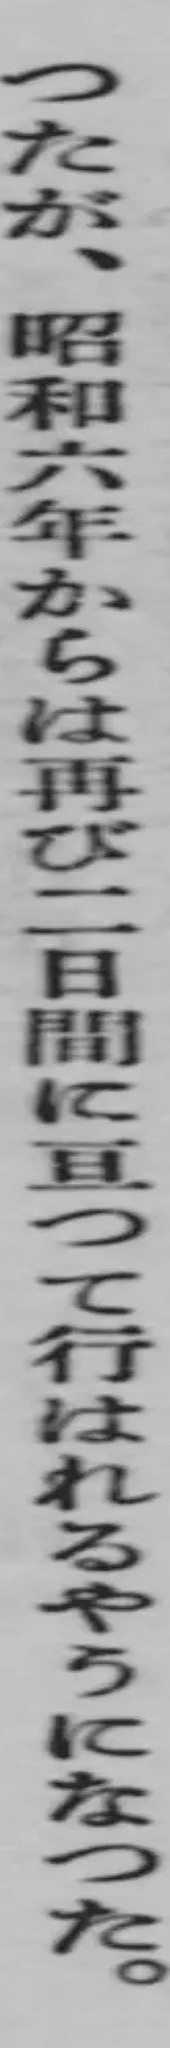つたが、昭和六年からは再び二日間に亘つて行はれるやうになつた。
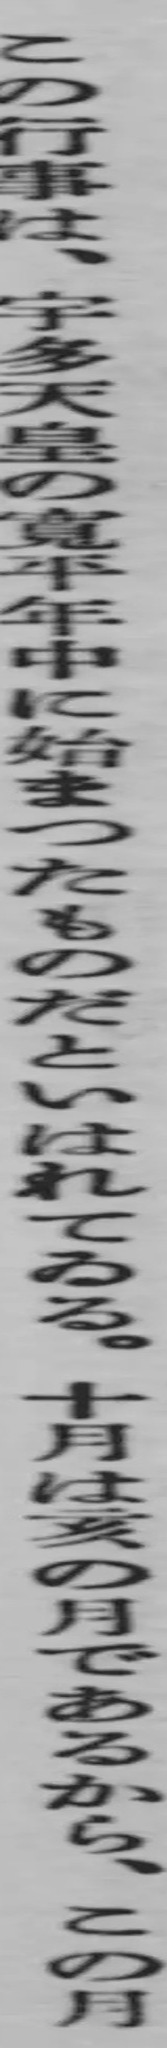この行事は、宇多天皇の寛平年中に始まつたものだといはれてゐる。十月は亥の月であるから、この月
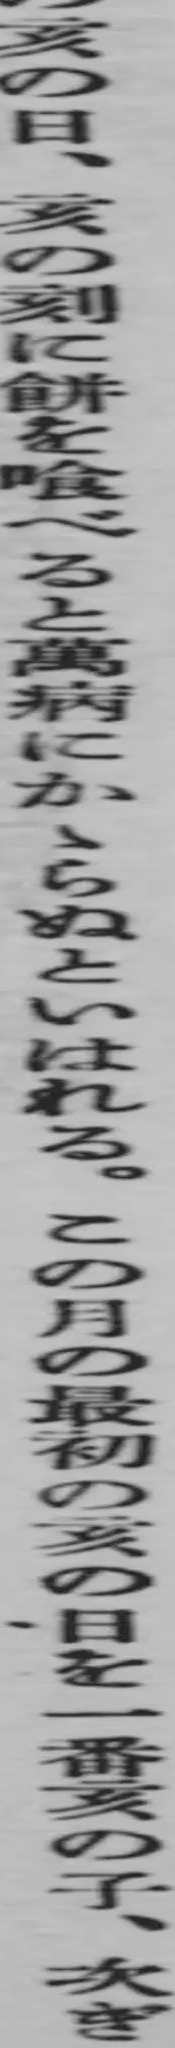の亥の日、亥の刻に餅を喰べると萬病にかゝらぬといはれる。この月の最初の亥の日を一番亥の子、次ぎ
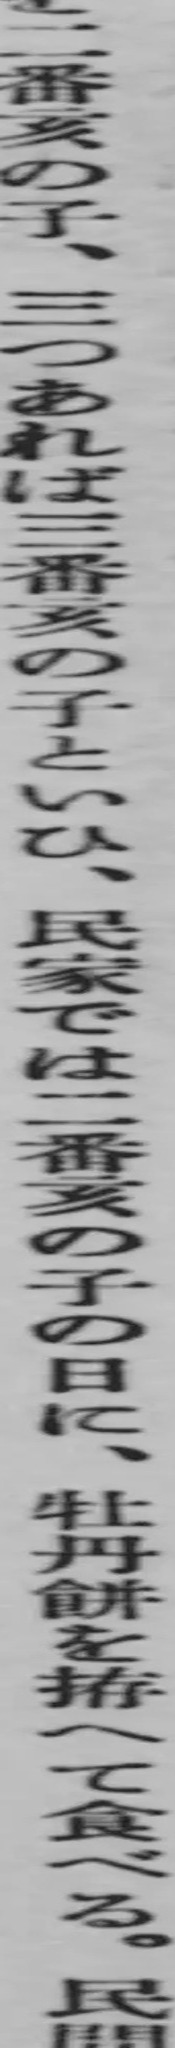を二番亥の子、三つあれば三番亥の子といひ、民家では二番亥の子の日に、牡丹餅を拵へて食べる。民間
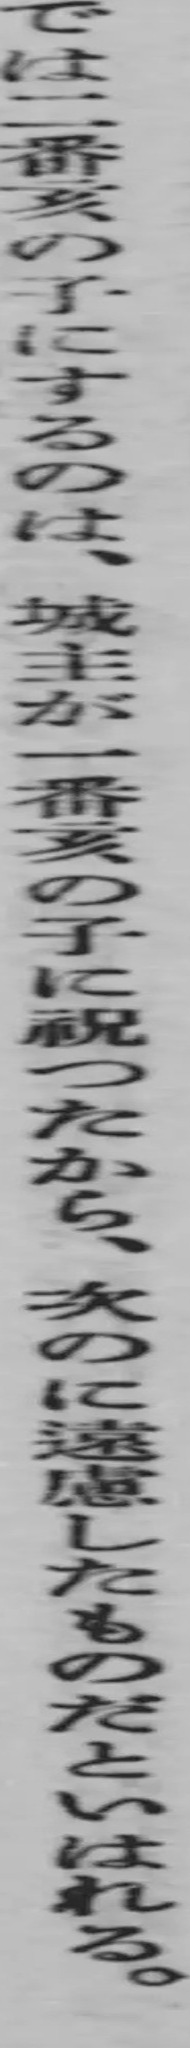では二番亥の子にするのは、城主が一番亥の子に祝つたから、次のに遠慮したものだといはれる。

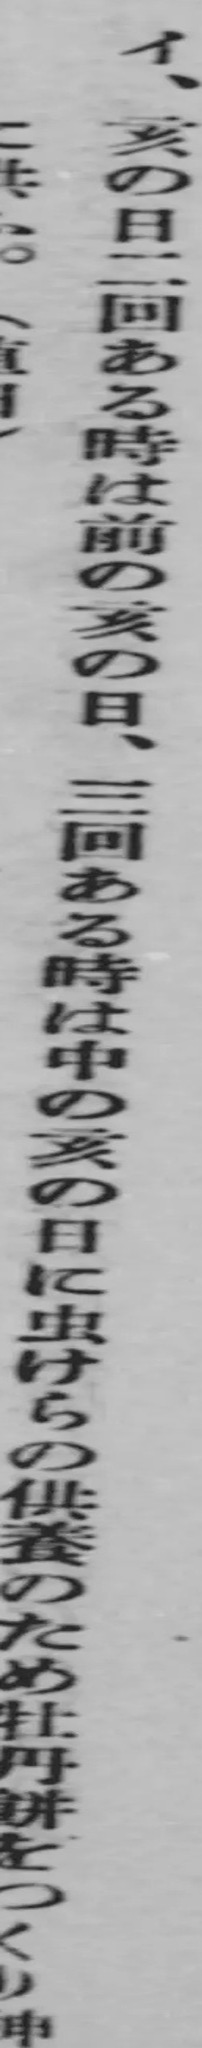イ、亥の日二回ある時は前の亥の日、三回ある時は中の亥の日に虫けらの供養のため牡丹餅をつくり神
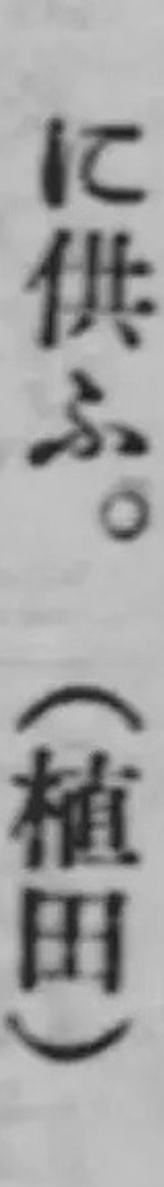に供ふ。(植田)
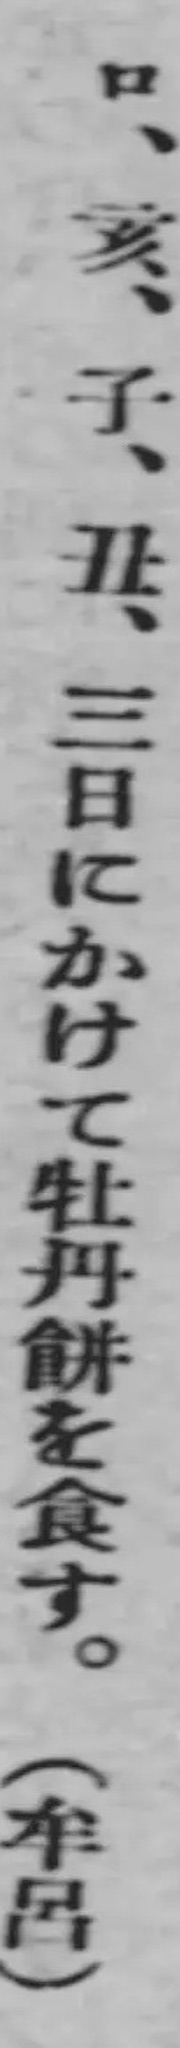ロ、亥、子、丑、三日にかけて牡丹餅を食す。(牟呂)
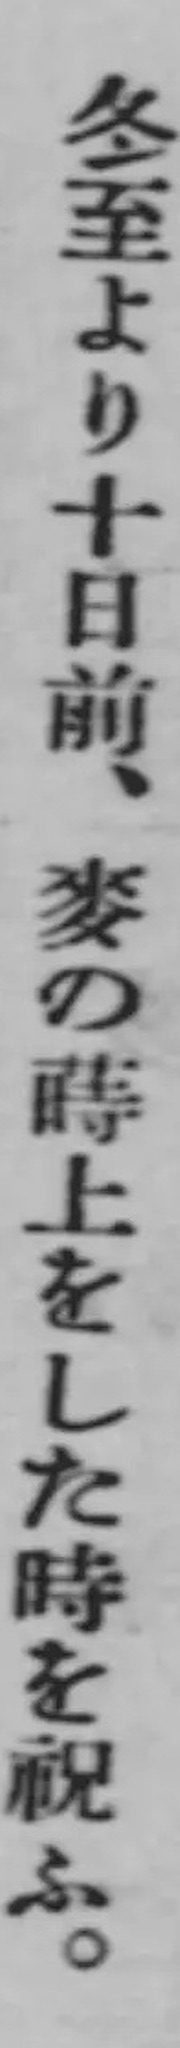冬至より十日間前、麥の蒔上をした時を祝ふ。
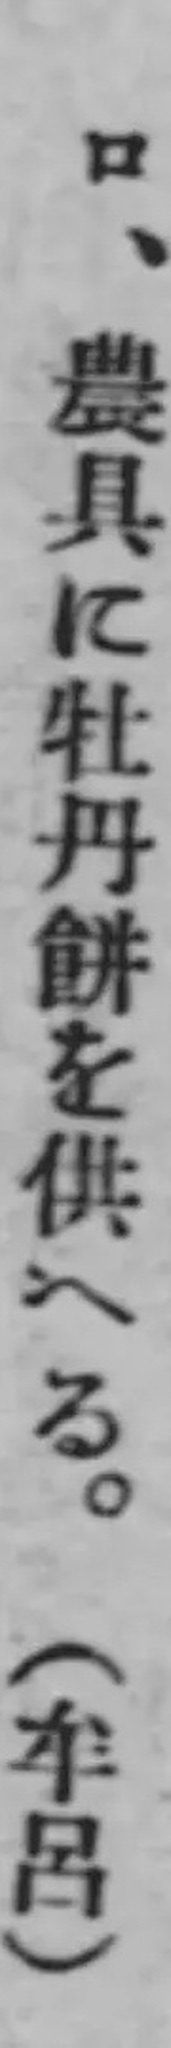ロ、農具に牡丹餅を供へる。(牟呂)
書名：豊橋の年中行事
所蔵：国立国会図書館 National Diet Library, JAPAN
